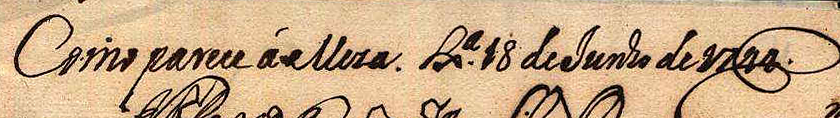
Como parece á Meza. Lx.a 18 de Iunho de 1744.
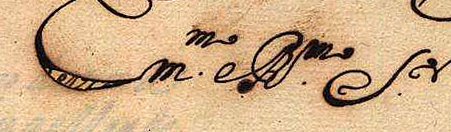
Em.mo e R.mo S.or
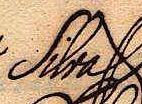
Silva
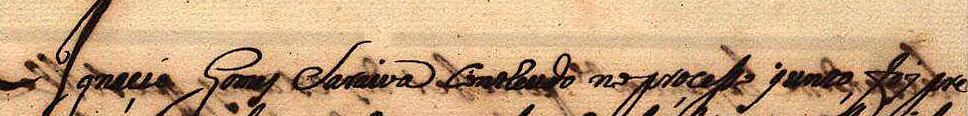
Jgnacio Gomes Saraiva Contheudo no processo junto, foj pre
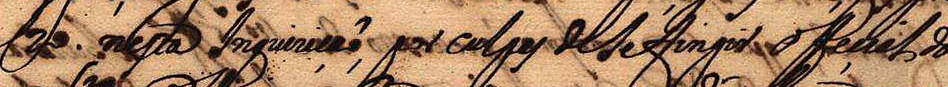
zo. nesta Inquiziçaõ por culpas de se fingir offecial do
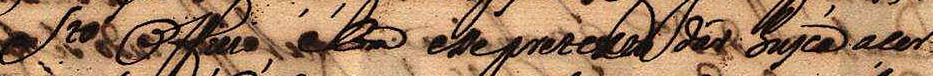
S.to Officio, e Com esse pretexto dar busca a cer
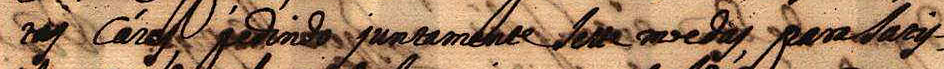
tas cazas, pedindo juntamente sette moedas para satis
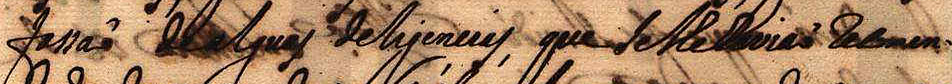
fassaõ de alguas deligencias, que se lhe haviaõ Recomen
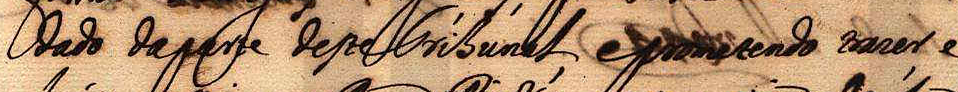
dado da parte deste Tribunal, e prometendo trazer, e
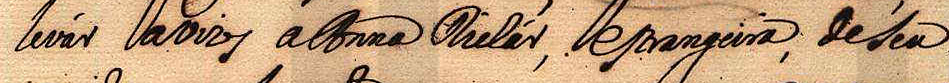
levar avizos a Anna Richar, estrangeira, de seu
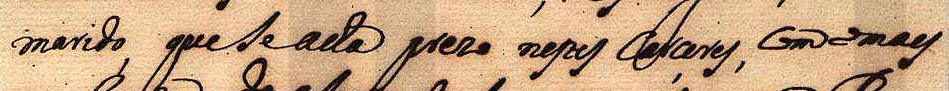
marido, que se acha prezo nestes Carceres, Com o maes
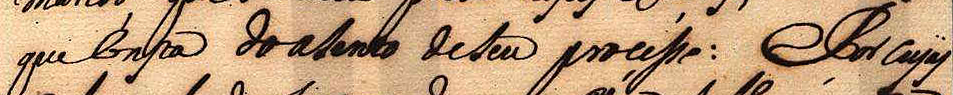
que Consta do asento de seu processo: e Por cujas
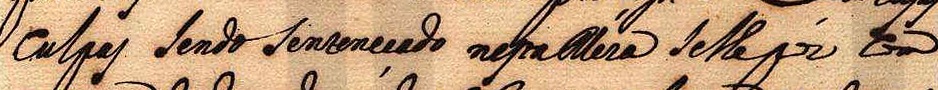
culpas sendo sentenceado nesta Meza se lhe poz com
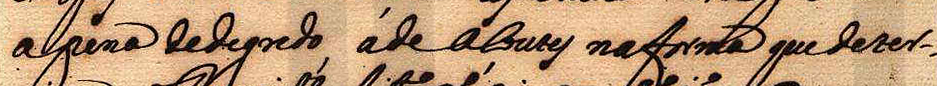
a pena de degredo, a de açoutes na forma que deter
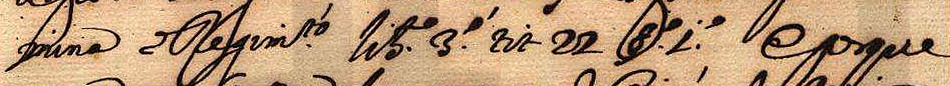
mina o Regim.to lib̄.o 3.o tit 22 §.o 1.o, e porque
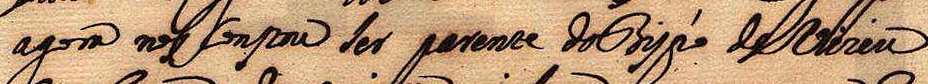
agora nos constou ser parente do Bispo de Vizeu
